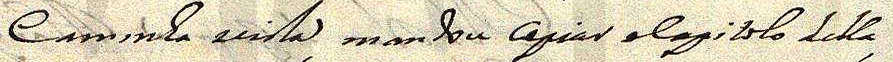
e a minha vista, mandou copiar o capitolo della,
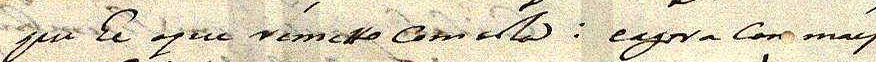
que he o que remetto com esta: e agora com mais
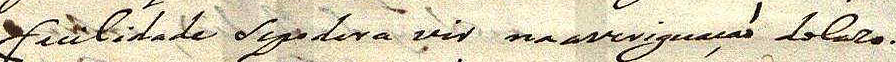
facilidade se podera vir, na averiguaçaõ do Cazo.
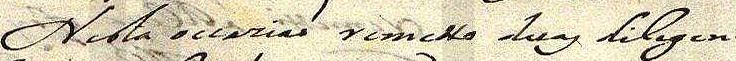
Nesta occaziaõ remetto duas diligen
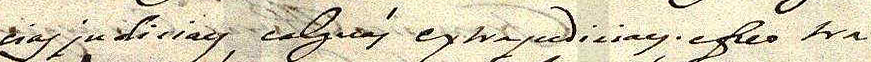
cias judiciaes, e alguās extrajudiciaes; e fico tra
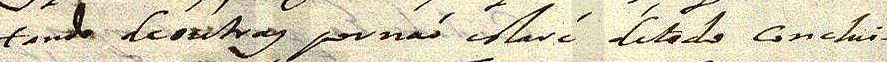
tando de outras por naõ estarē de todo conclui
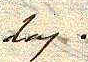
das.
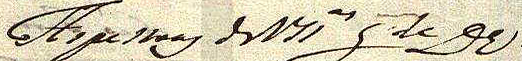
As pessoas de VSsas g.de DE.
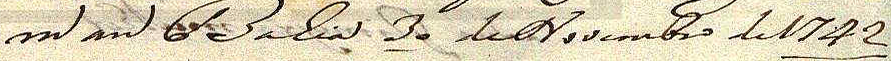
m̄ an̄ Bahia 30 de Novembro de 1742
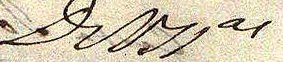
Ds VSSas
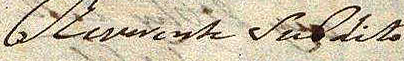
Reverente Subdito
